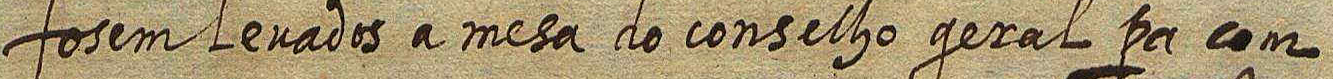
fosem leuados a mesa do conselho geral ꝑa com
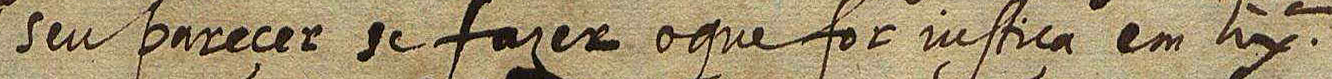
seu pareçer se fazer o que for iustiça em lix.a
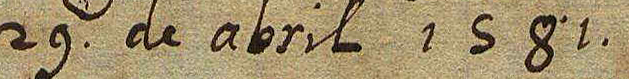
29. de abril 1581.
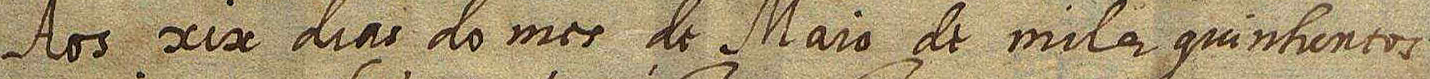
Aos xix dias do mes de Maio de mil E quinhentos
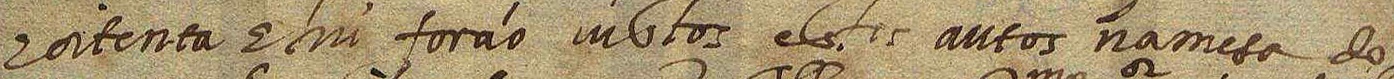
E oitenta E hū foraõ uistos estes autos na mesa do
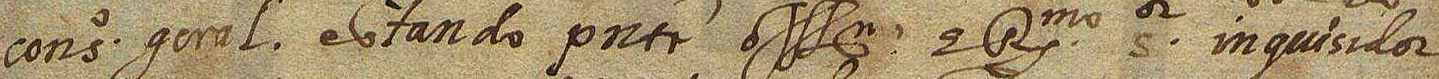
cons.o geral. estando pntē o Jllmo E Rꝭ.mo s.or inquisidor
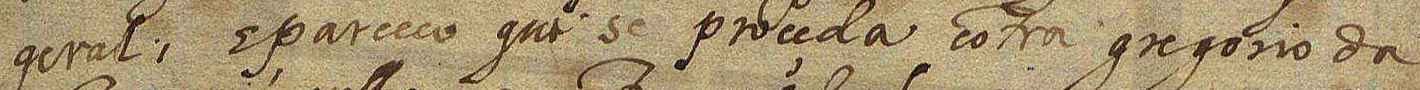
geral, E pareceo que se proçeda cōtra gregorio da
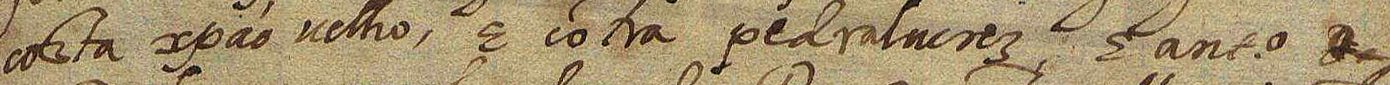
costa xpão uelho, E cōtra pedraluerez E anto da
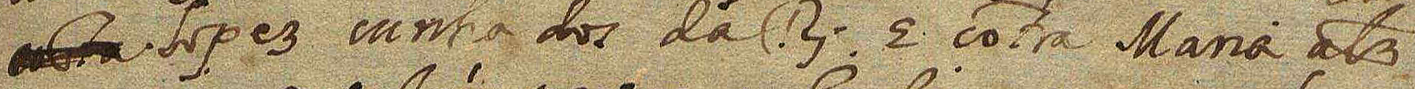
costa. lopez cunhados da R. E cōtra Maria al̄z
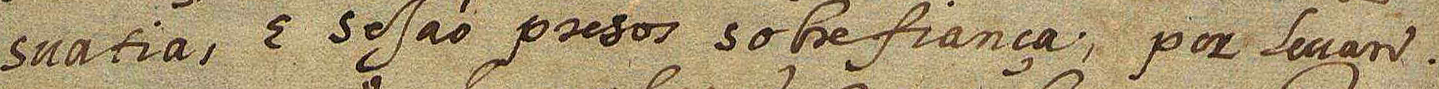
sua tia, E seJaõ presos sobre fiança; por leuarē
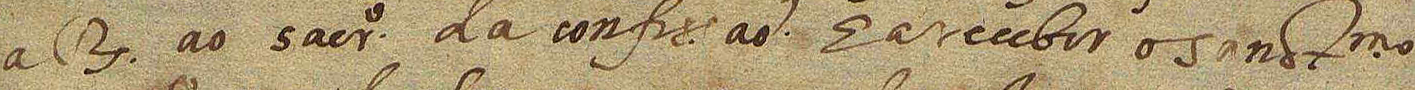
a R. ao sacr.o da confissaõ E a receber o sanct.mo
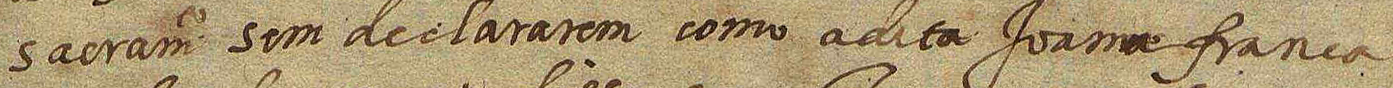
sacram.to sem declararem como a dita Joama franca
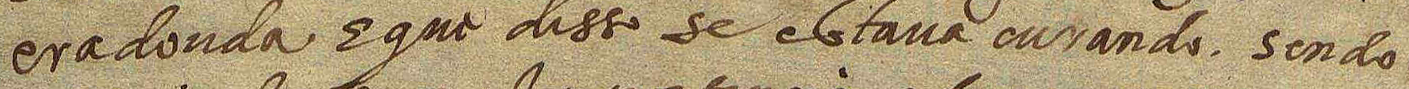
era douda. E que disso se estaua curando. sendo
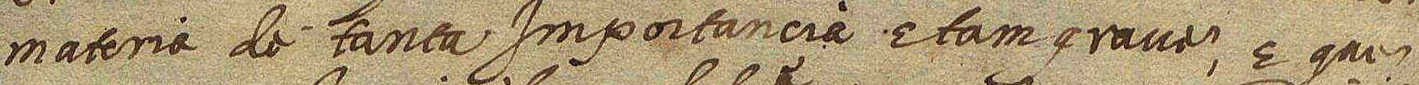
materia de tanta Jmportançia E tam graue, E que
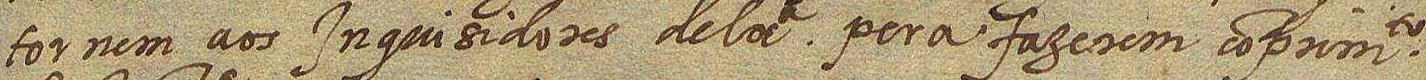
tornem aos Jnquisidores de lxa pera fazerem cōprimto.
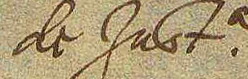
de Justa.
